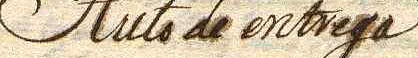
Auto de entrega
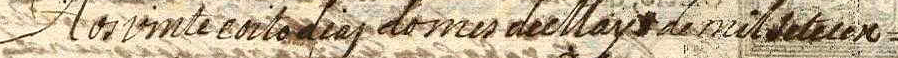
Aos vinte e oito dias do mes de Mayo de mil setecen
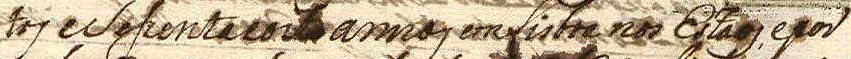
tos e sessenta e oito annos em Lisboa nos Estaos, e por
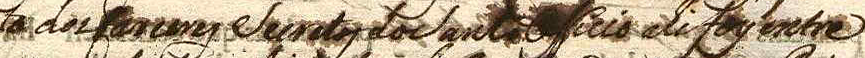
ta dos Carceres Secretos do Santo Officio ahi foy entre
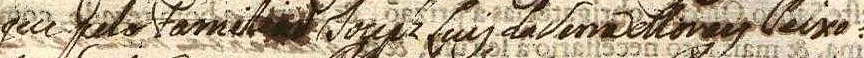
gue pelo Famil_ Jozeph Luis da Serra Moraes Peixo
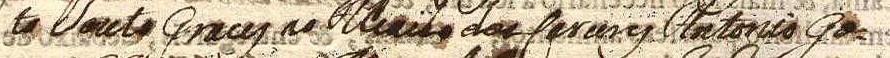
to Souto Graces ao Alcaide dos Carceres Antonio Go
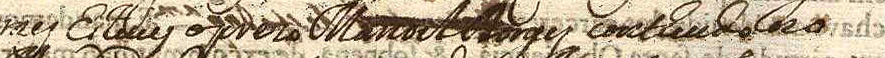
mes Esteues o prezo Manoel Borges contheudo no
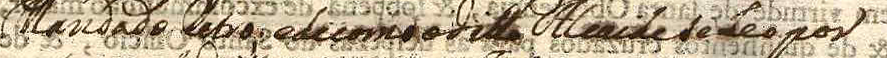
Mandado Retro, e de como o ditto Alcaide se deo por
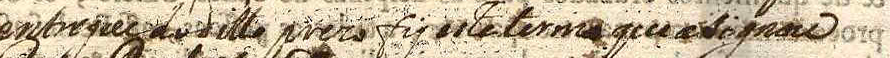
entregue do ditto prezo fis este termo que asignou
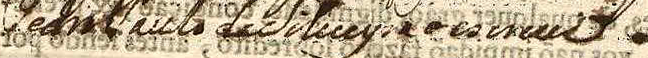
Pedro Paulo de Silueyra o escreui.
